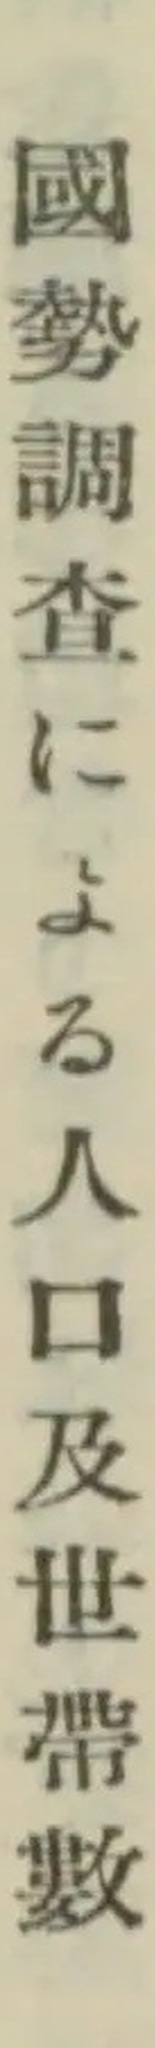国勢調査による人口及世帯数
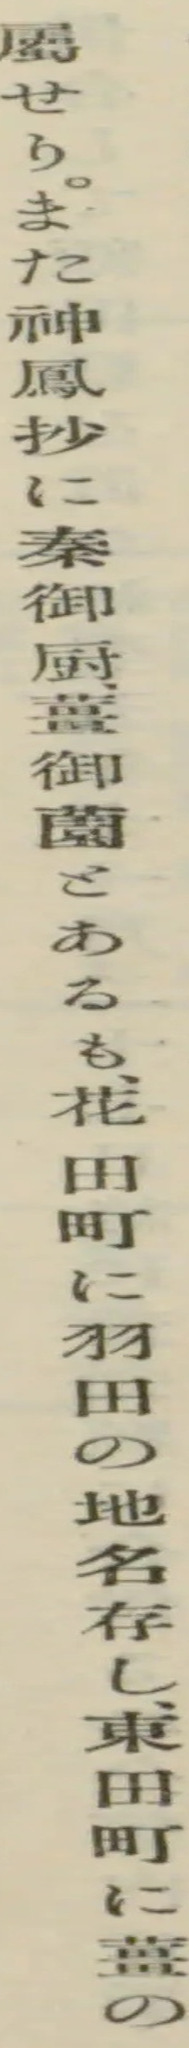屬せり。また神鳳抄に秦御厨薑御薗とあるも、花田町に羽田の地名存し、東田町に薑の
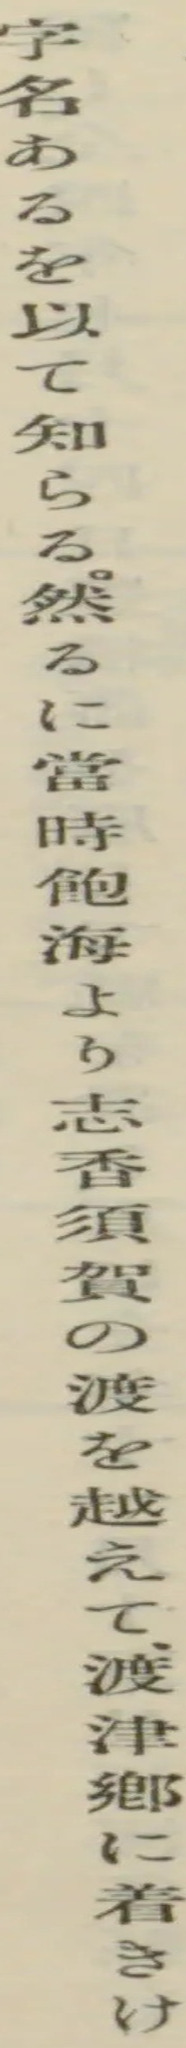字名あるを以て知らる。然るに当時飽海より志香須賀の渡を越えて、渡津郷に着きけ
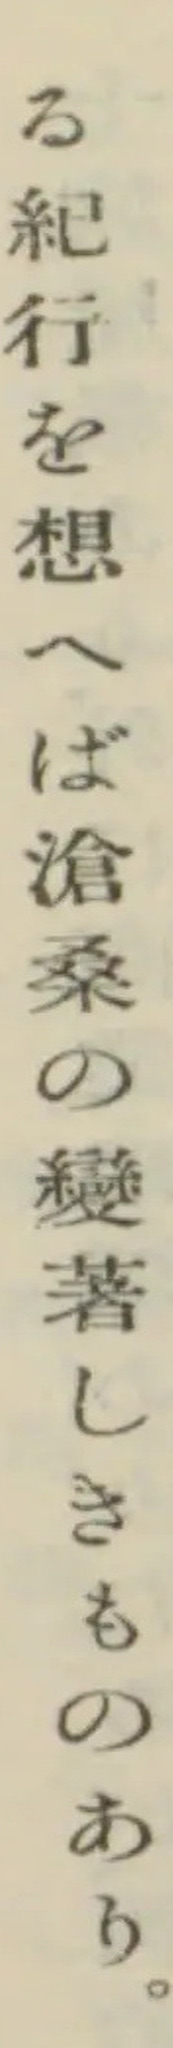る紀行を想へば滄桑の變著しきものあり。
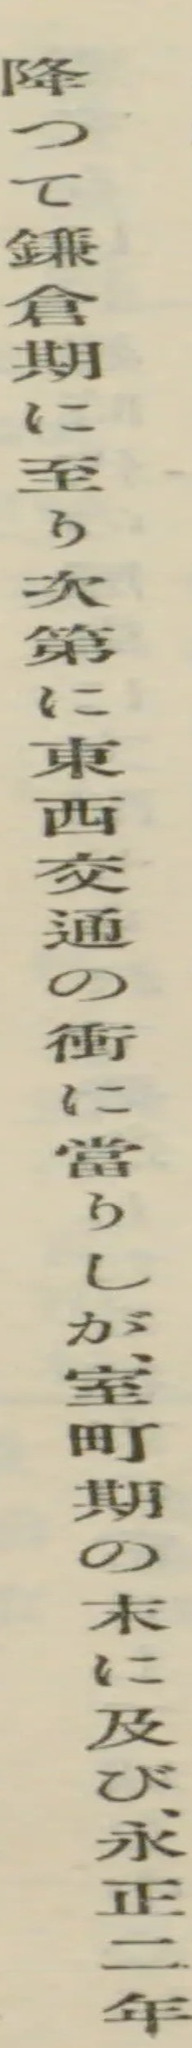降って鎌倉期に至り次第に東西交通の衝に当りしが、室町期の末に及び、永正二年
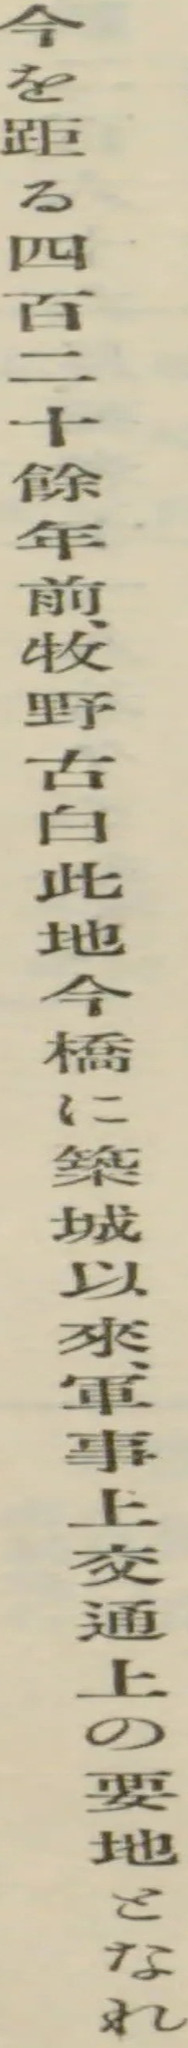今を距る四百二十余年前、牧野古白此地今橋に築城以来、軍事上交通上の要地な
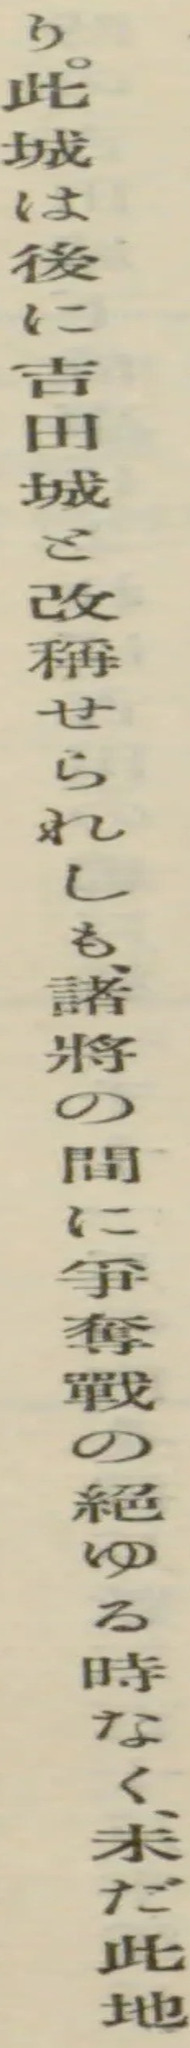り。此城は後に吉田城と改稱せられしも、諸将の間に争奪戦の絶ゆる時なく、未だ此地
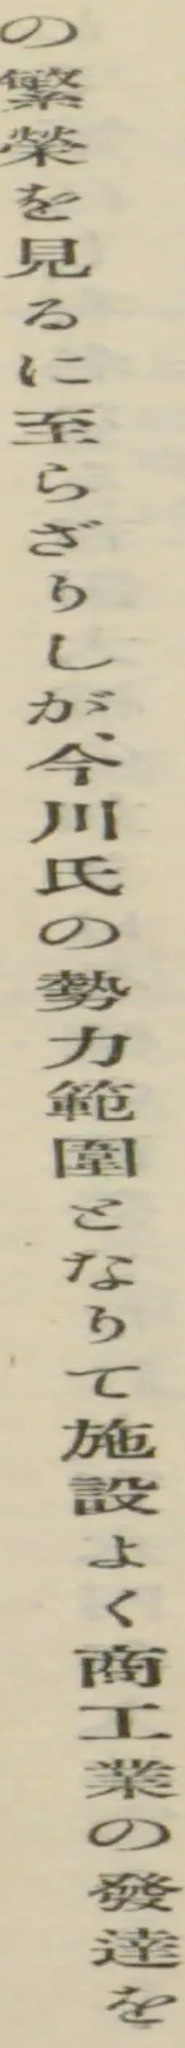の繁栄を見るに至らざりしが、今川氏の勢力範囲となりて施設よく商工業の発達を
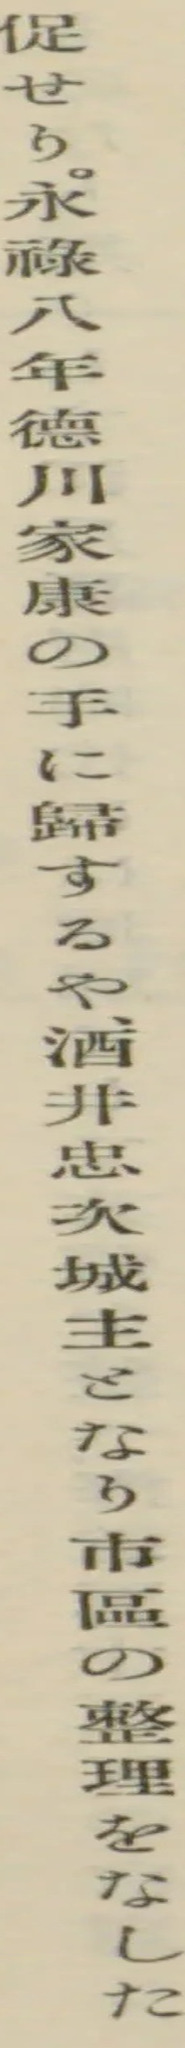促せせり。永禄八年徳川家康の手に帰するや、酒井忠次城主となりし市区の整理をなした
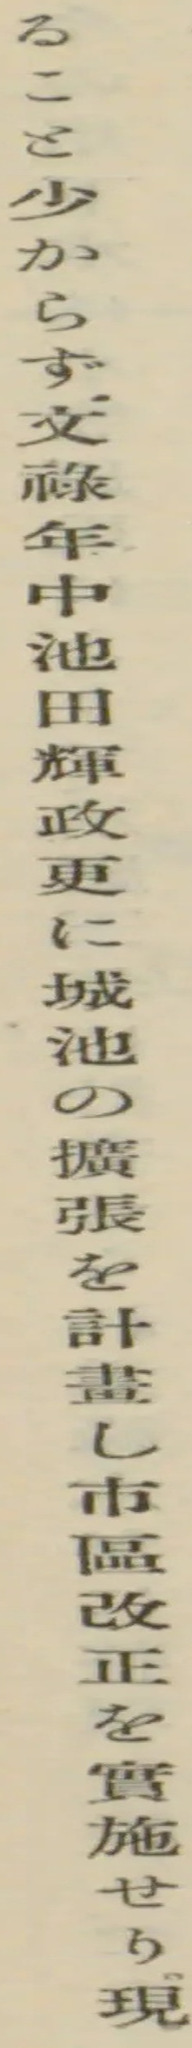ること少なからず。文禄年中池田輝政更に拡張を計画し市区改正を実施せり。現
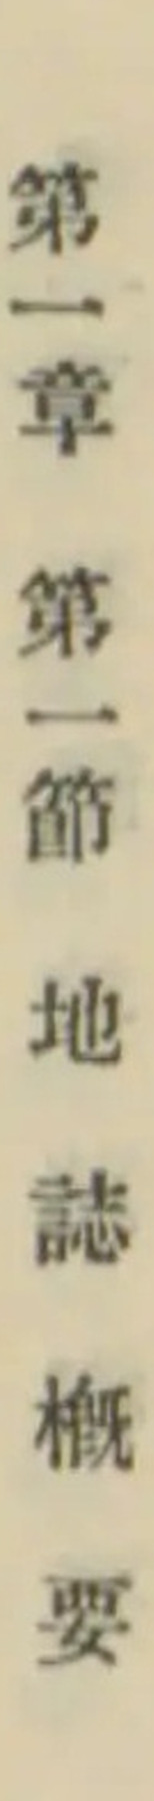第一章第一節地誌概要四

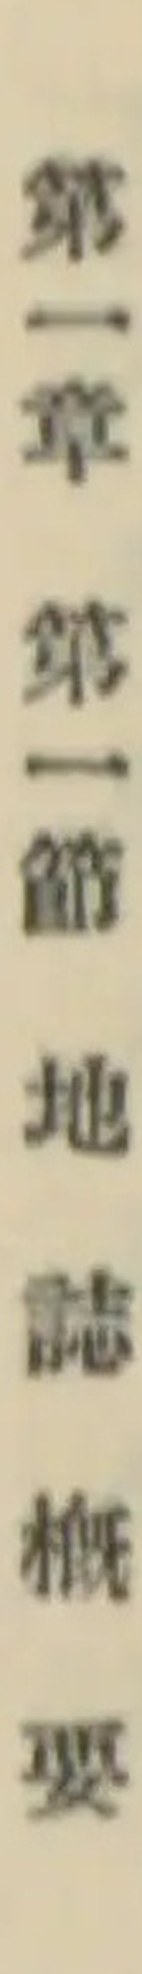第一章第一節地誌概要八
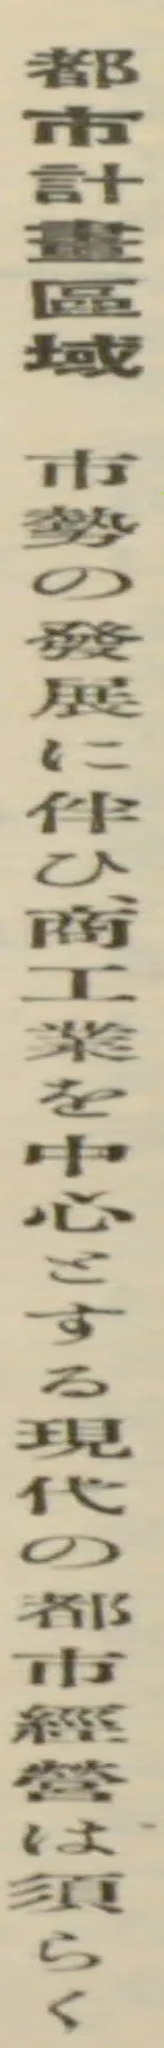都市計画区域市勢の発展に伴ひ、商工業を中心とする現代の都市経営は須らく
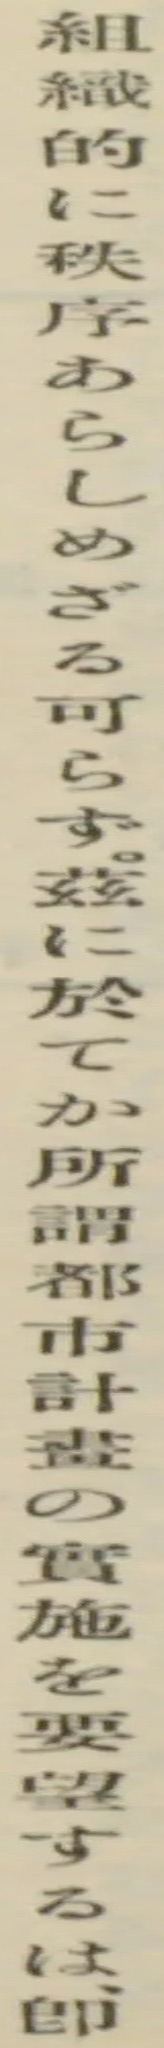組織的にち秩序あらしめざる可らず、茲に於てか所謂都市計画の実施を要望するは、即
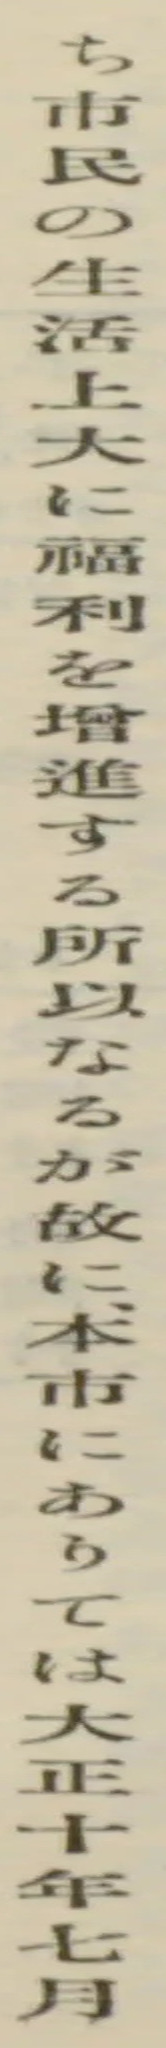ち市民の生活上大に福利を増進する所以なるが故に、本市にありては大正十年七月
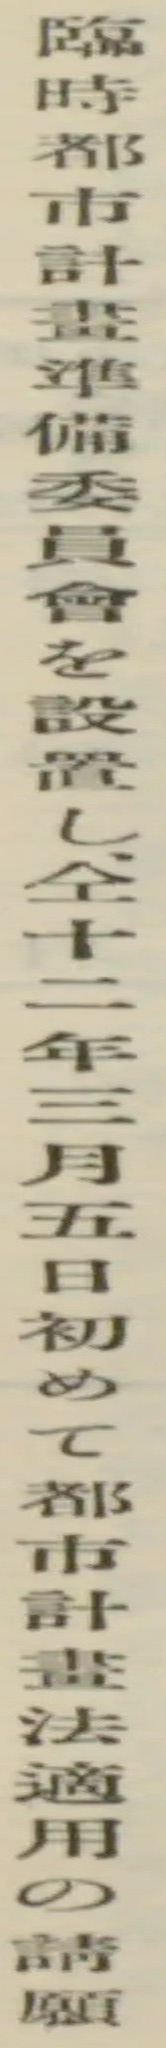臨時都市計画準備委員会を設置し、同十二年三月五日初めて都市計画法適用の請願
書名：豊橋市水道誌
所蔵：国立国会図書館 National Diet Library, JAPAN
